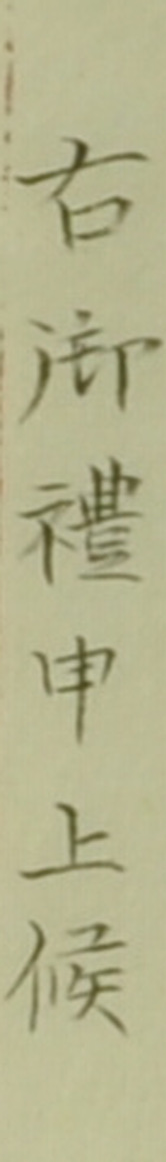右御礼申上候
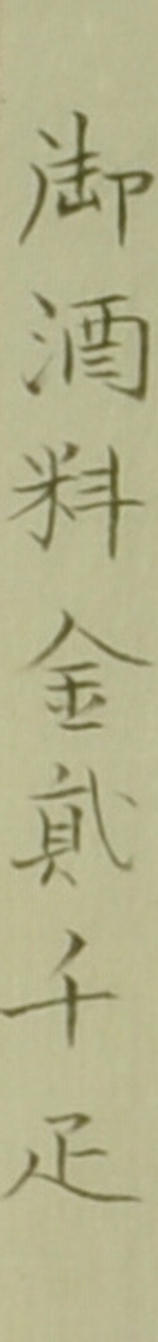御酒料金弐千疋

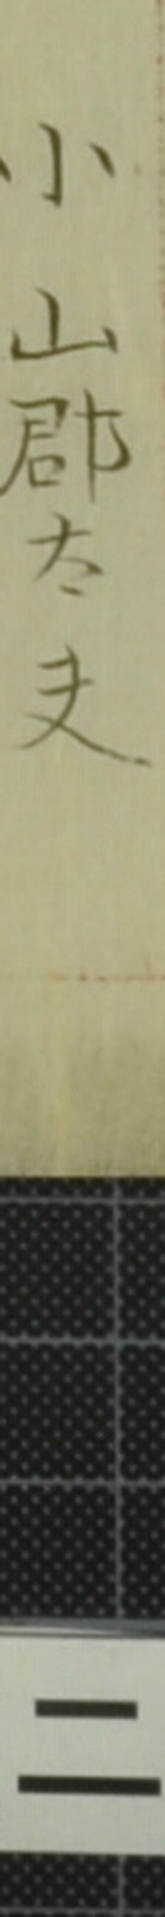小山郡太夫
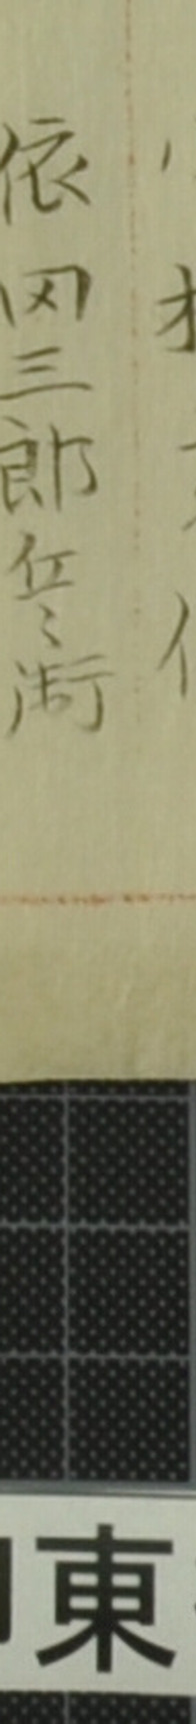依田三郎兵衛
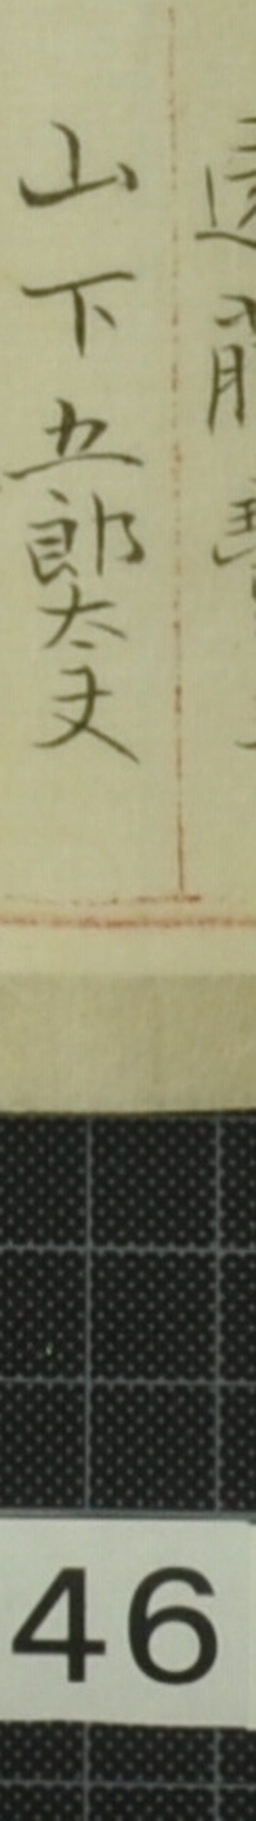山下五郎太夫
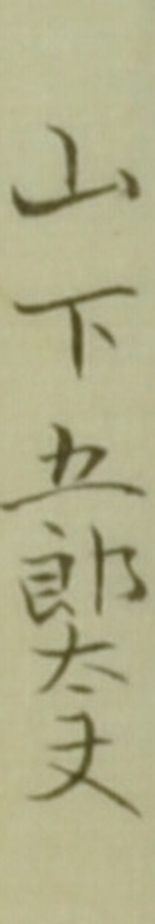山下五郎太夫
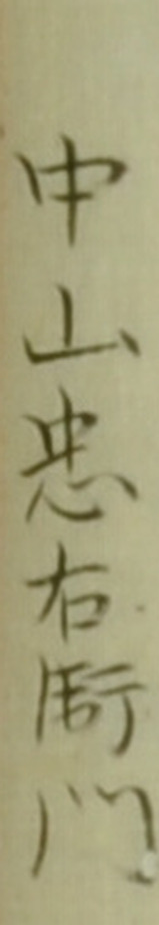中山忠右衛門
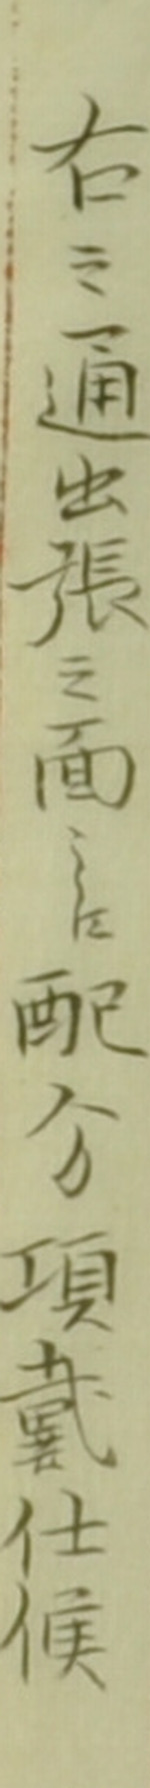右之通出張之面々江配分頂戴仕候
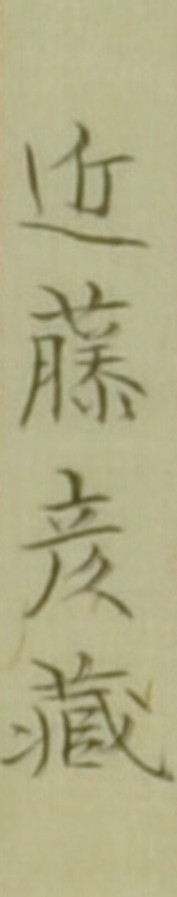近藤彦蔵
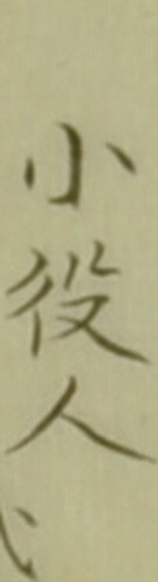小役人

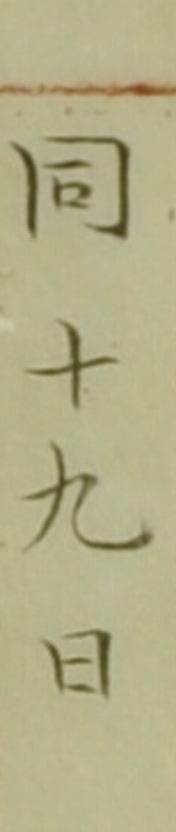同十九日
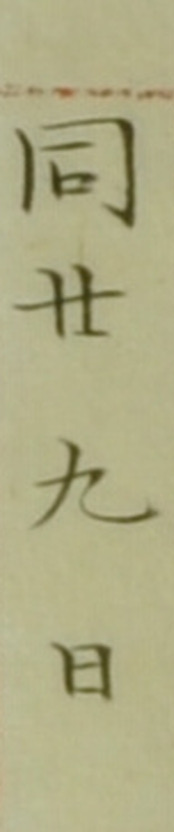同廿九日
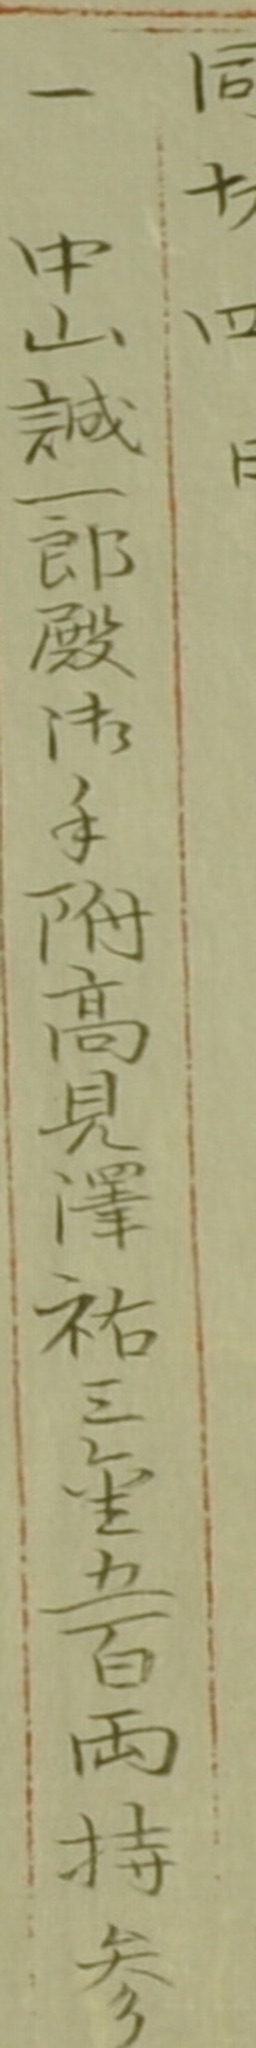一中山誠一郎殿御手附高見澤祐三金五百両持参
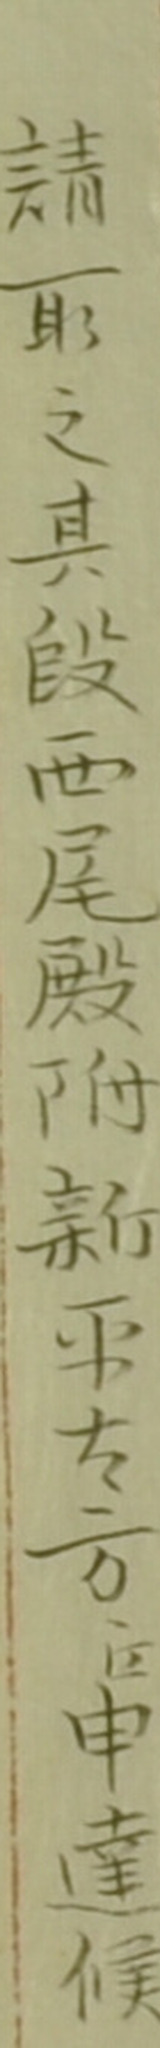請取之其段西尾殿附新平太方江申達候
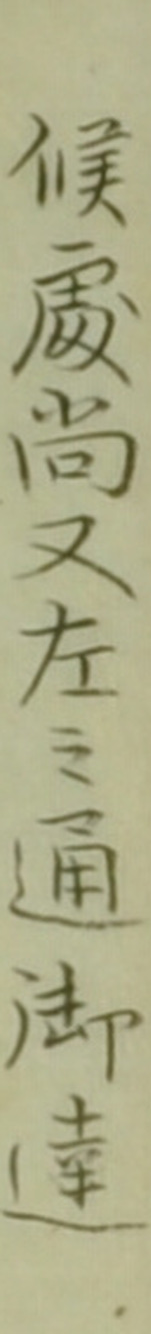候處尚左之通御達
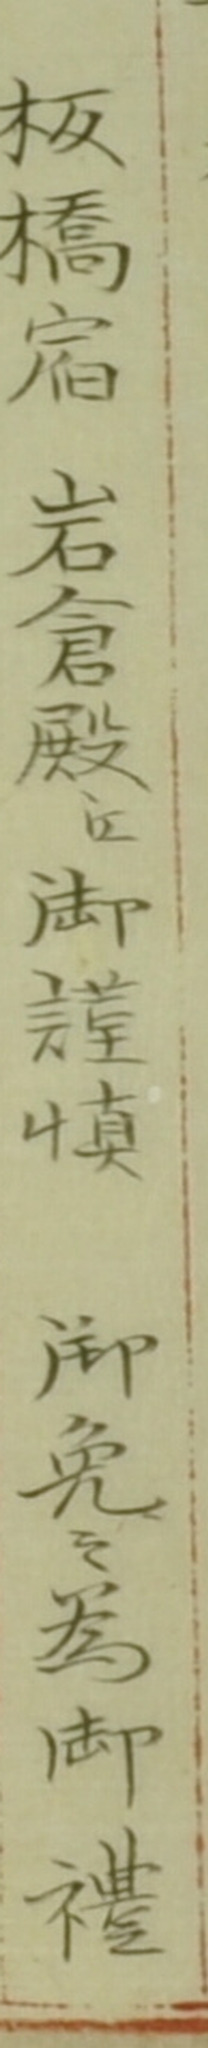一板橋宿岩倉殿江御謹慎御免之為御禮
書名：御東征ニ付甲州口兵食人馬御賄之事件（控）
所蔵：伊那市立高遠町図書館・合同会社AMANE
